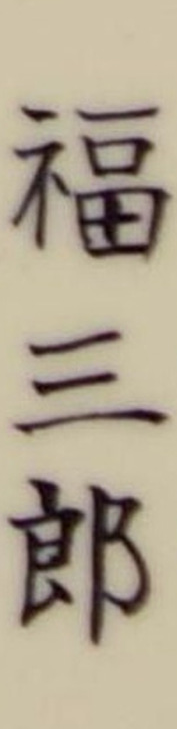福三郎
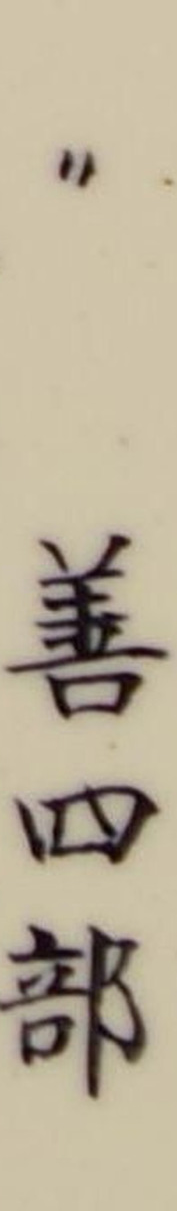善四部
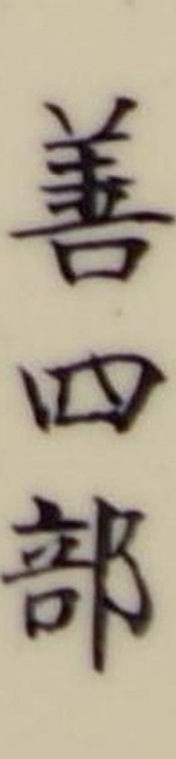善四部
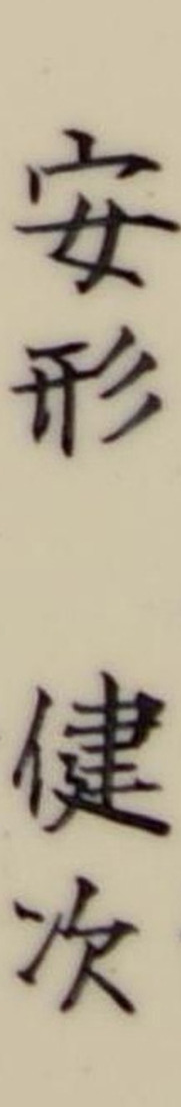安形健次
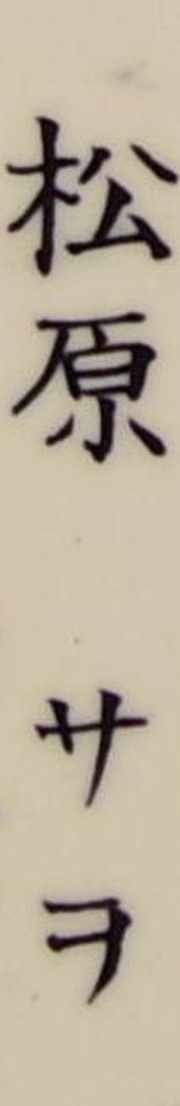松原サヲ
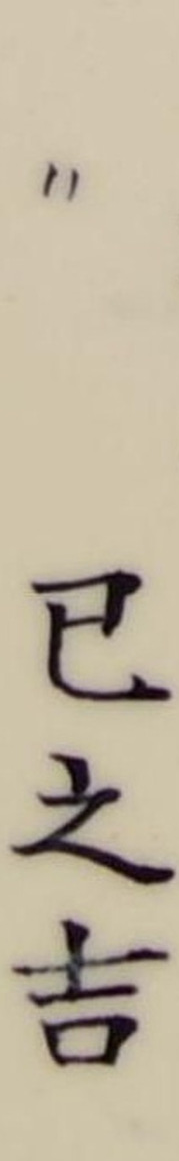巳之吉
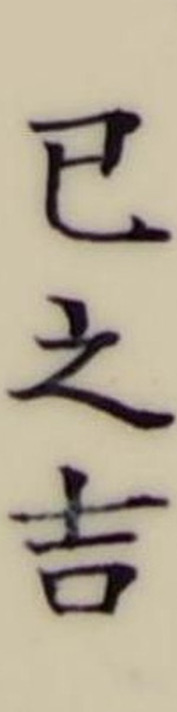巳之吉
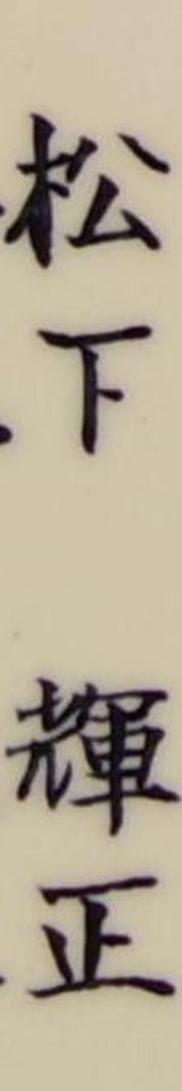松下輝正
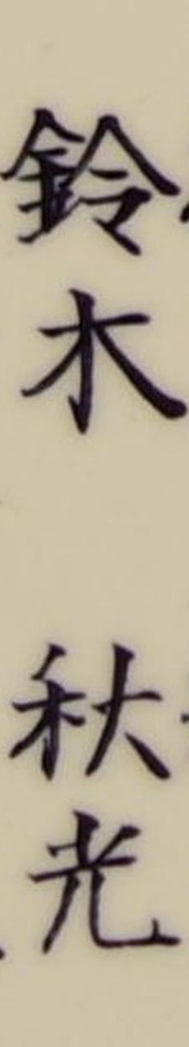鈴木秋光
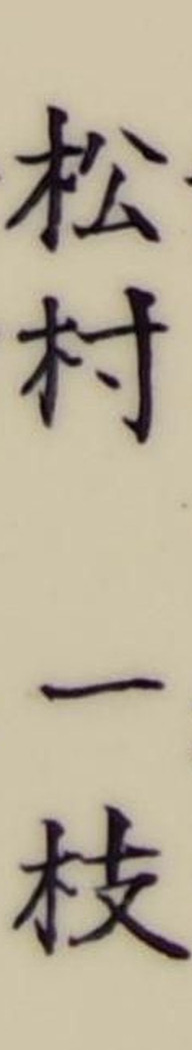松村一枝
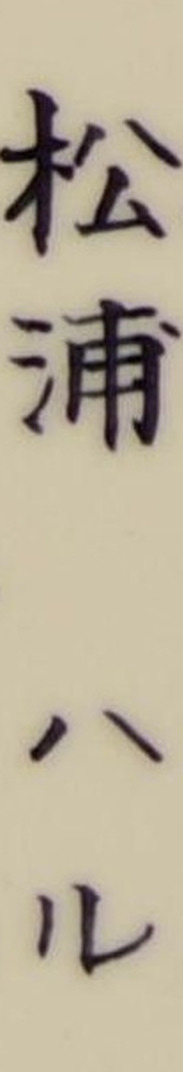松浦ハル
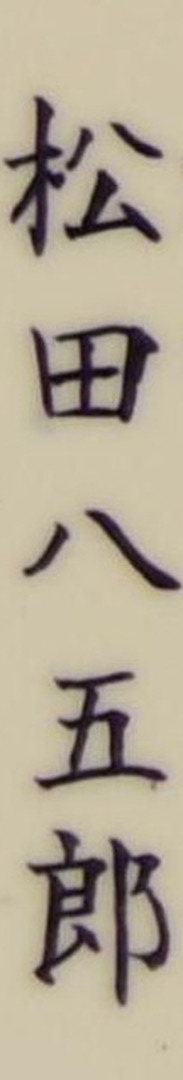松田八五郎
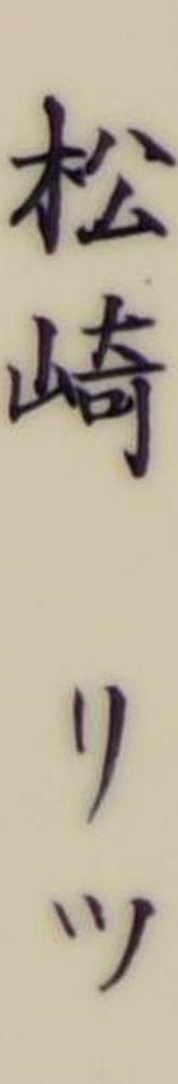松崎リツ
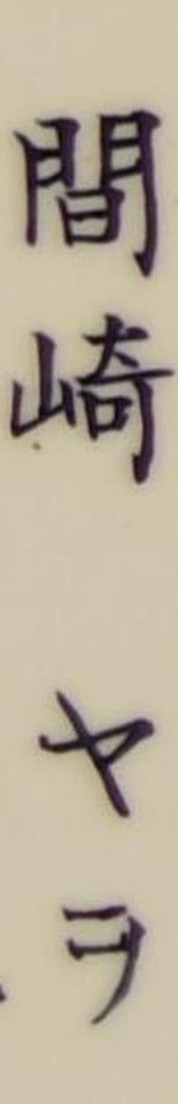間崎ヤヲ
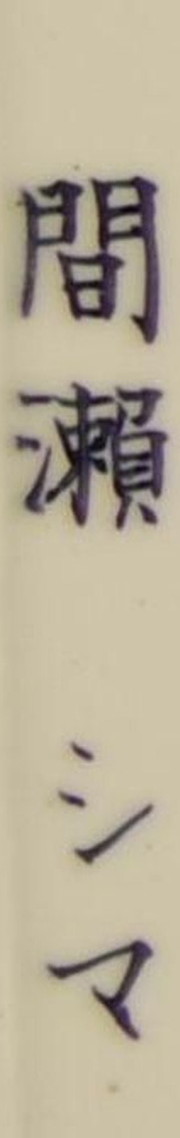間瀨シマ

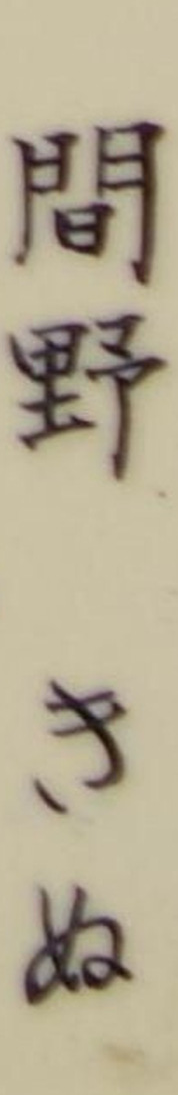間野きぬ
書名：E~L
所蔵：高野山金剛峯寺
